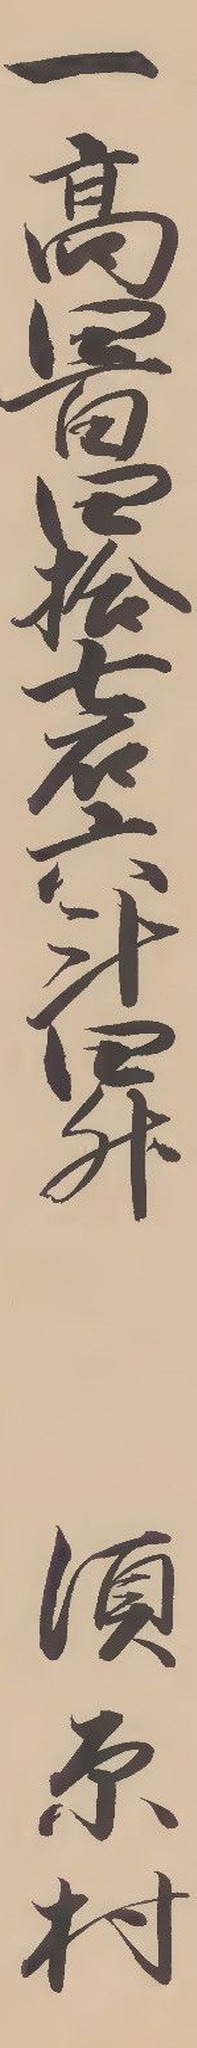一高四百四拾七石六斗四升須原村

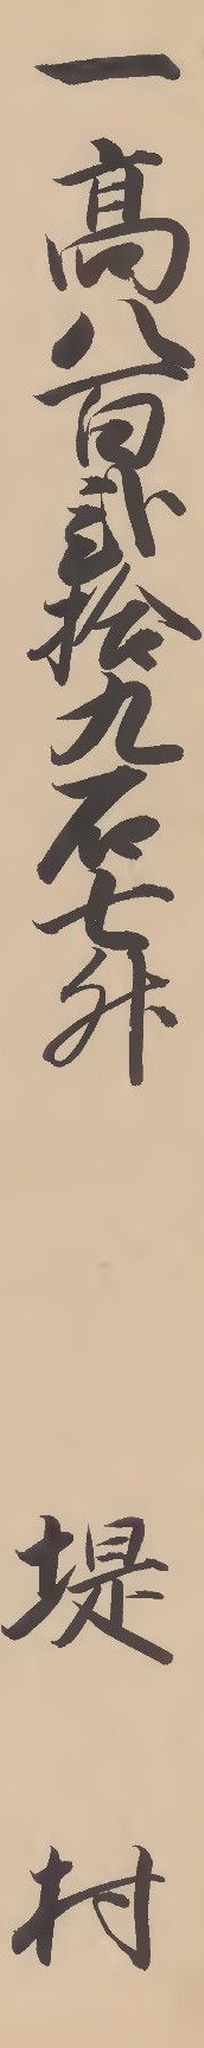一高八百弐拾九石七升堤村
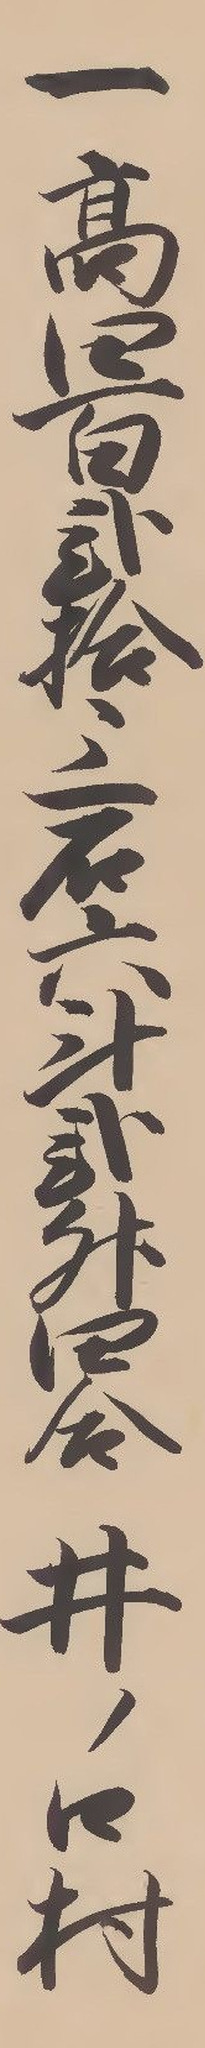一高四百弐拾三石六斗弐升四合井ノ口村
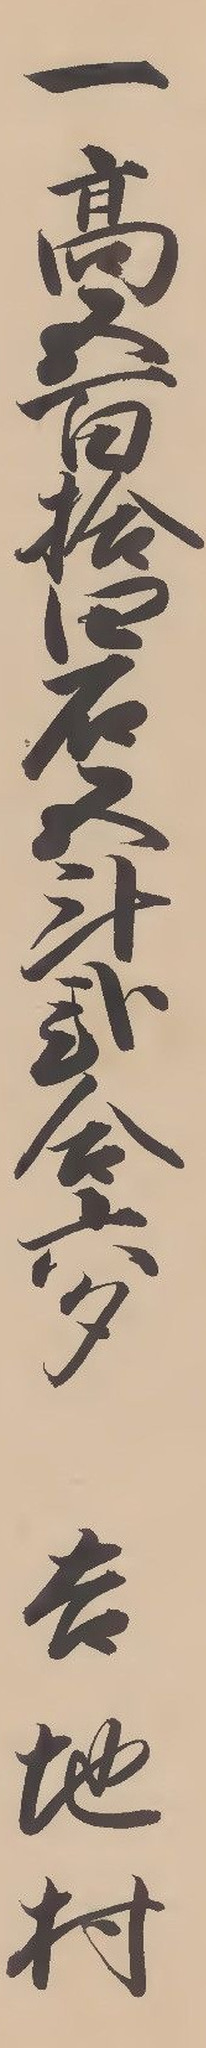一高五百拾四石五斗弐合六勺吉地村
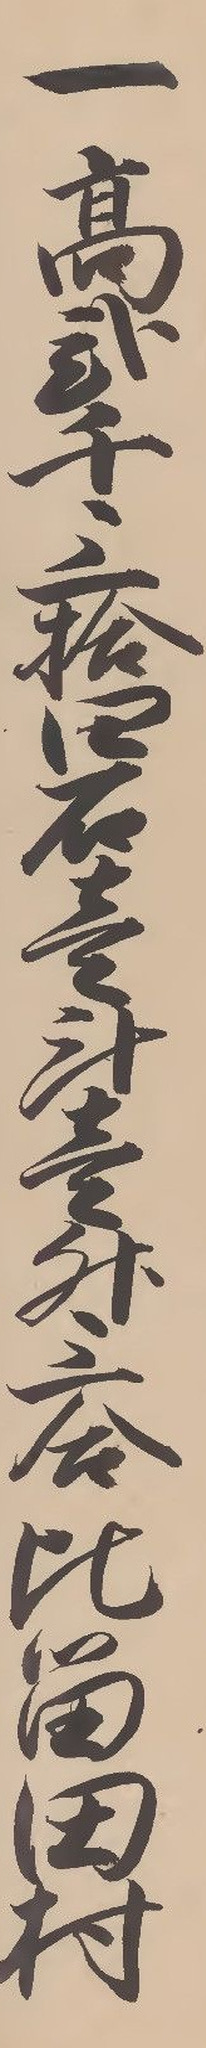一高弐千三拾四石壱斗壱升三合比留田村
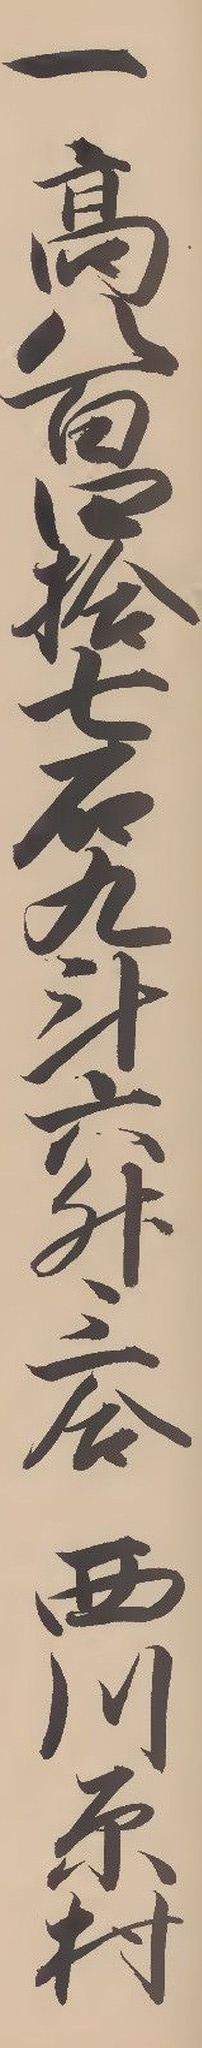一高八百四拾七石九斗六升三合西川原村
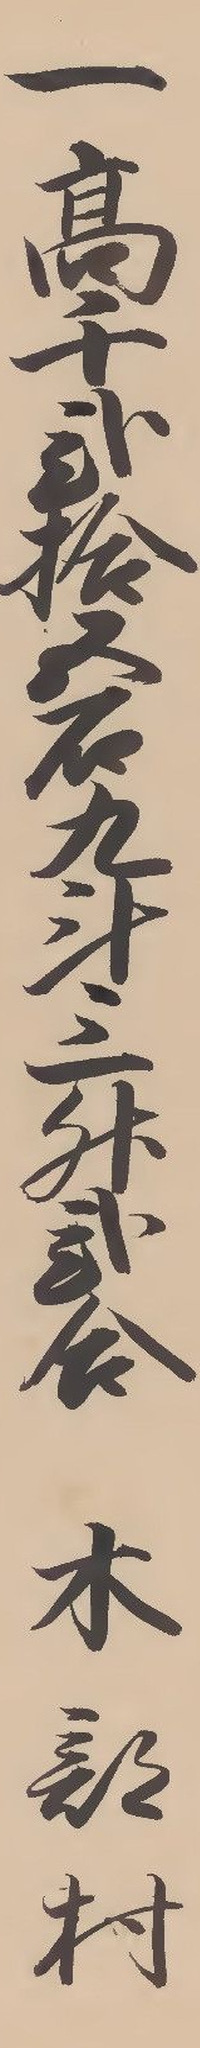一高千弐拾五石九斗三升弐合木部村
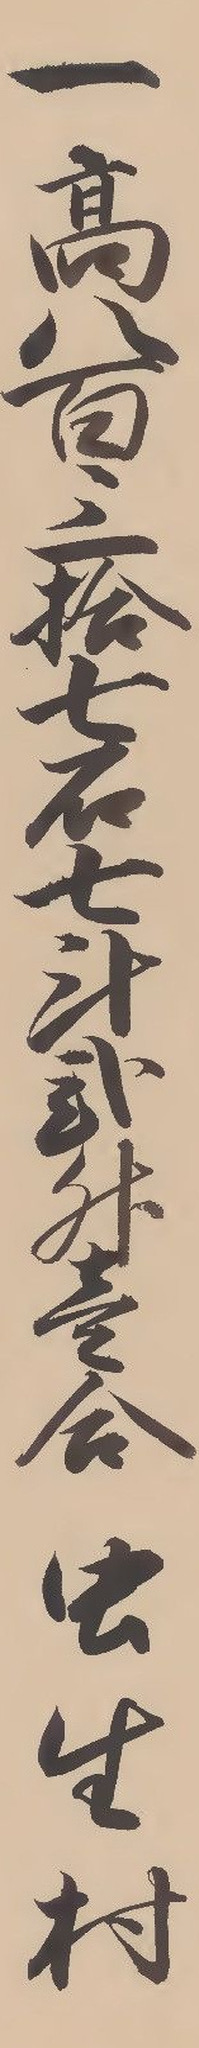一高八百三拾七石七斗弐升壱合虫生村
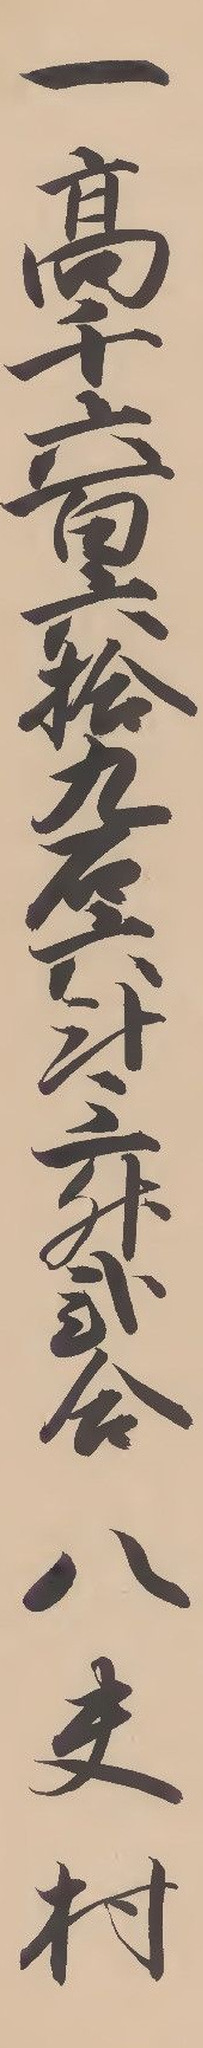一高千六百六拾九石六斗三升弐合八夫村

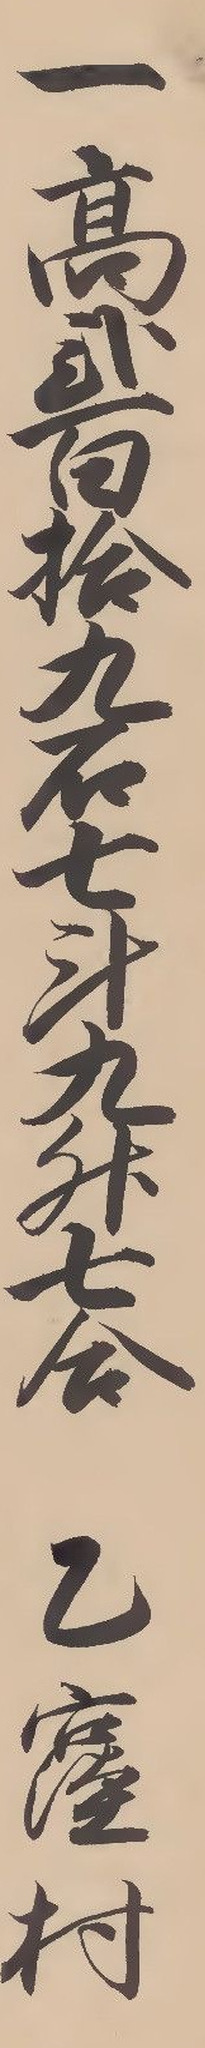一高弐百拾九石七斗九升七合乙窪村
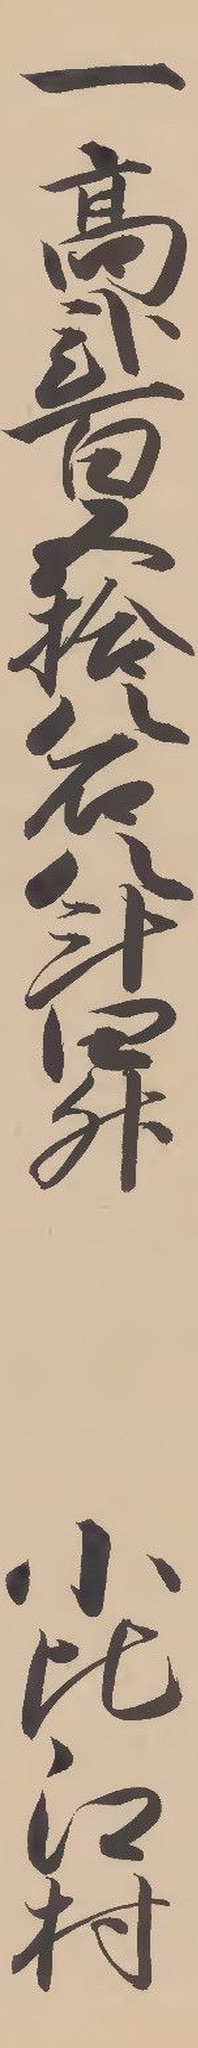一高弐百五拾八石八斗四升小比江村
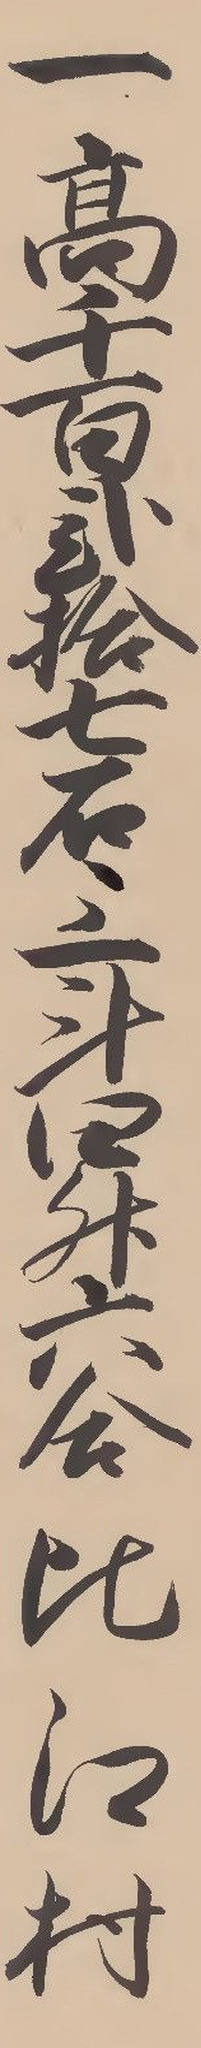一高千百弐拾七石三斗四升六合比江村
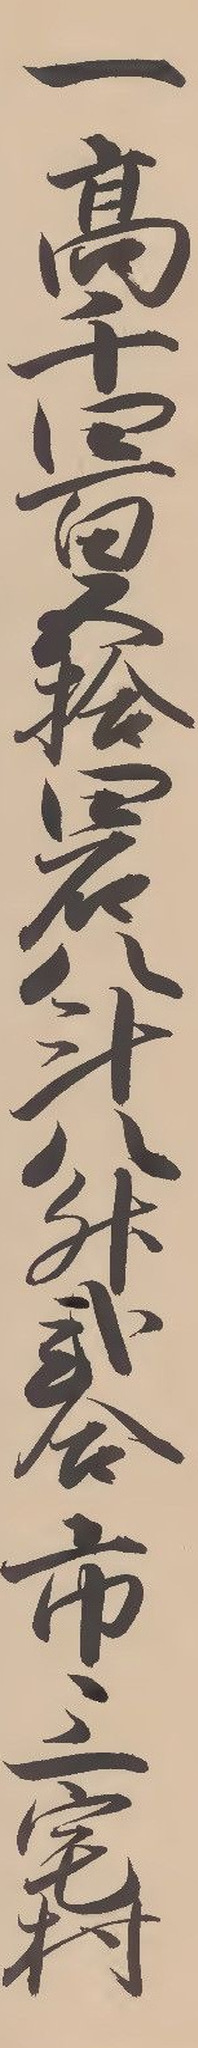一高千四百五拾四石八斗八升弐合市三宅村
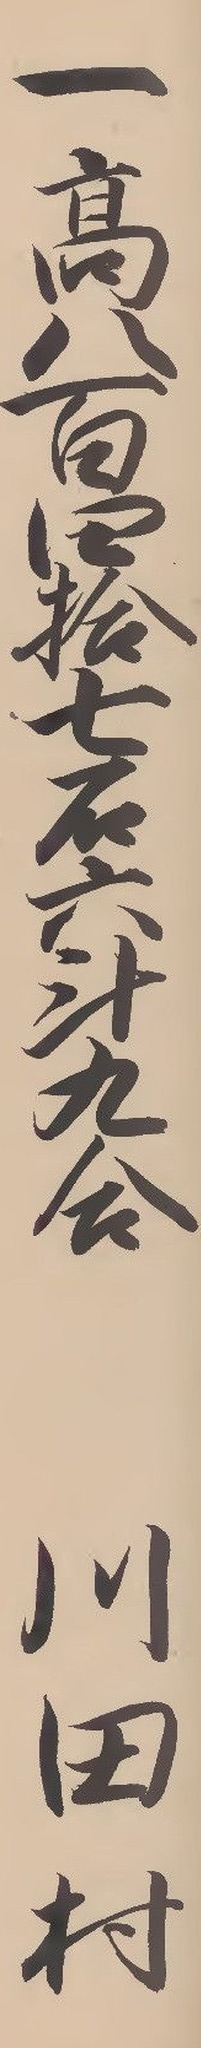一高八百四拾七石六斗九合川田村
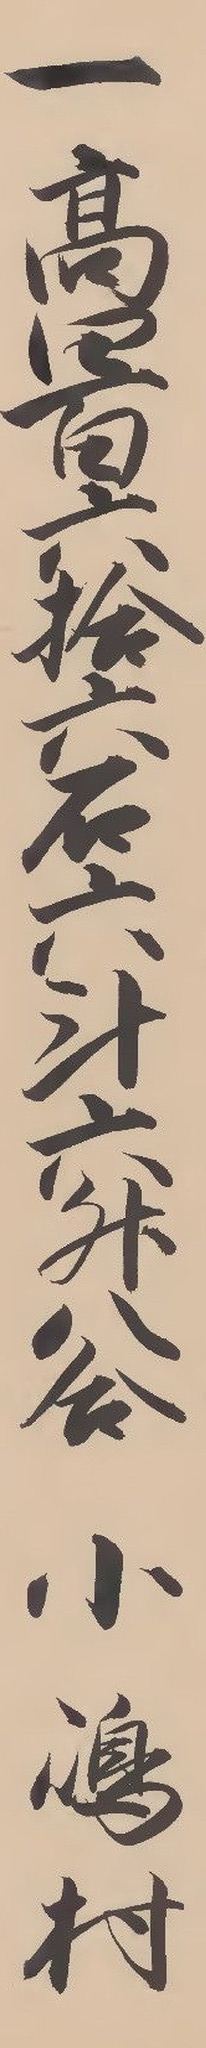一高四百六拾六石六斗六升八合小島村
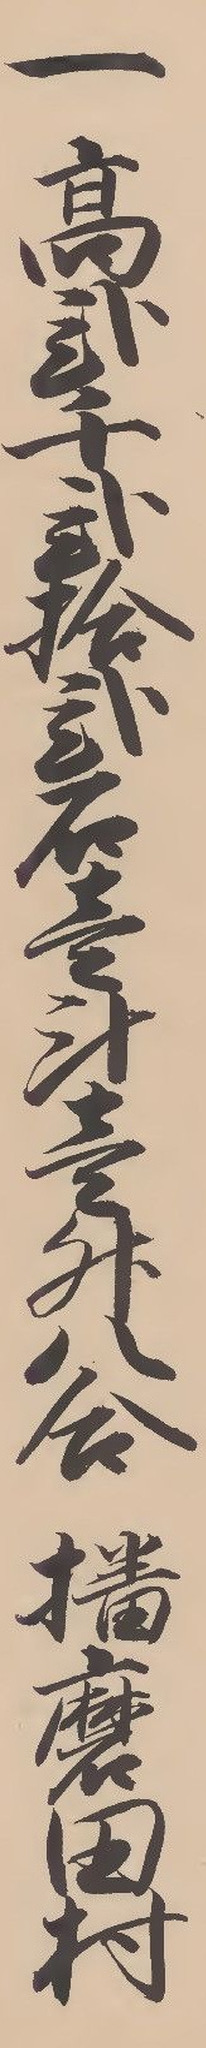一高弐千弐拾弐石壱斗壱升八合播磨田村
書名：近江国郷帳
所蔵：国立公文書館 National Archives of Japan
